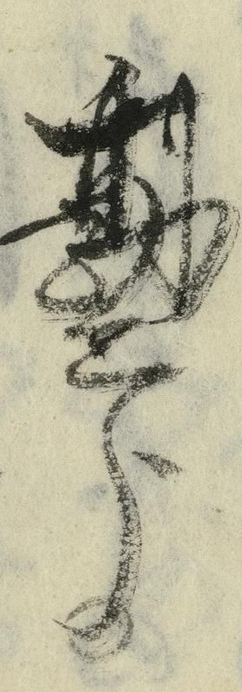金兵衛
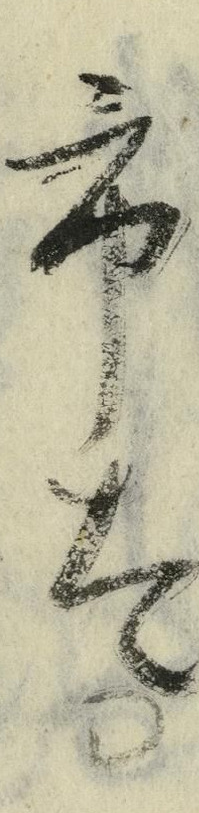義右衛門
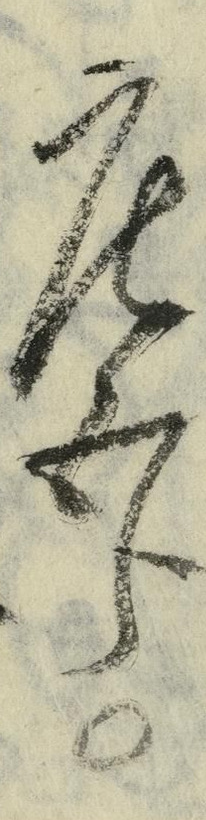定五郎
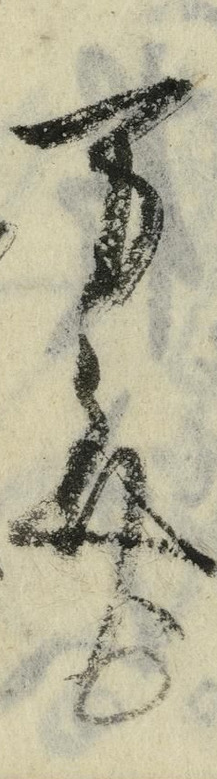金兵衛
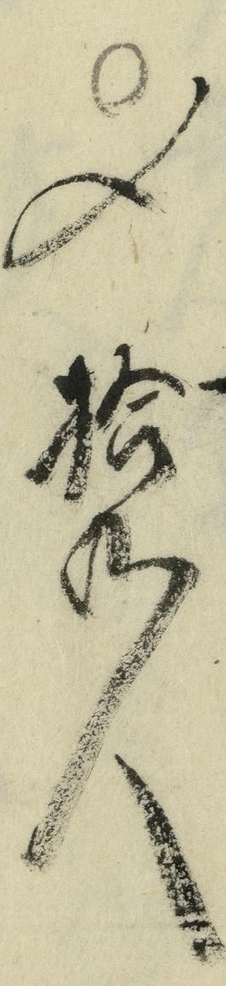〆拾九人
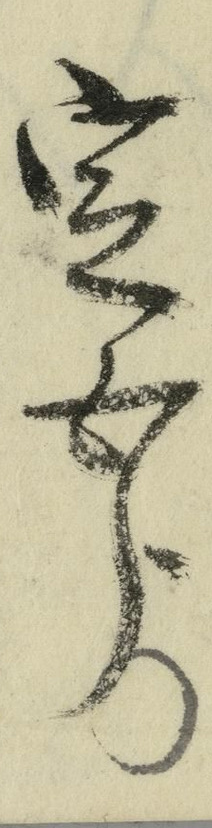定五郎
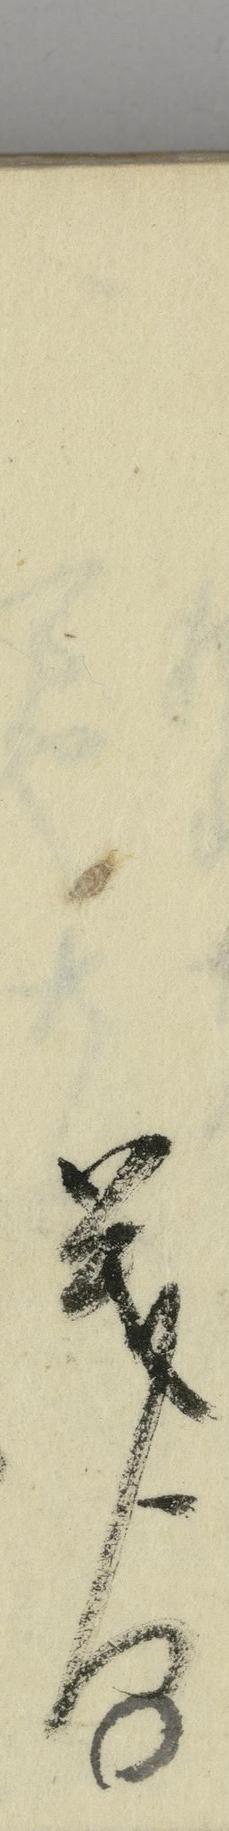義右衛門
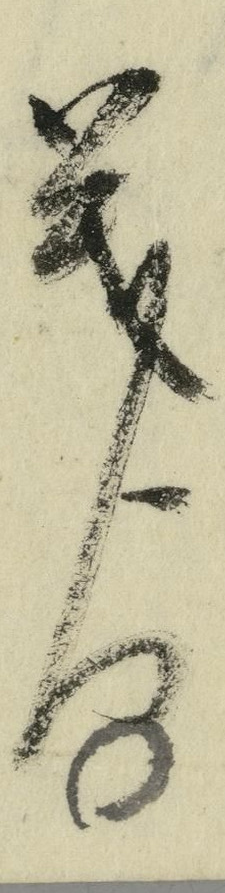義右衛門
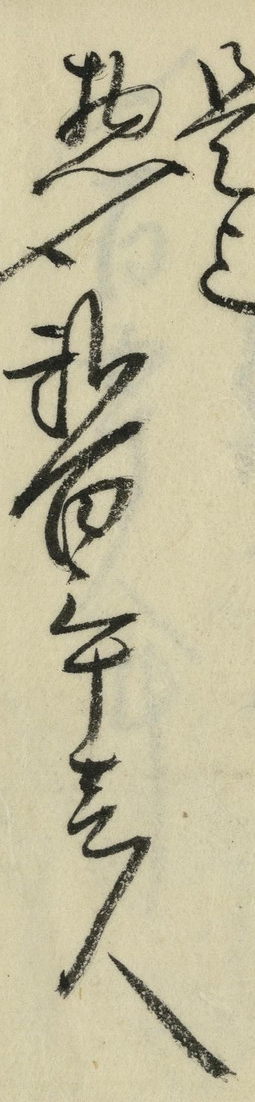惣〆弐百三十壱人
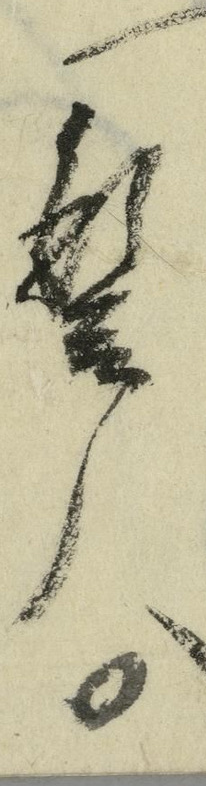金兵衛
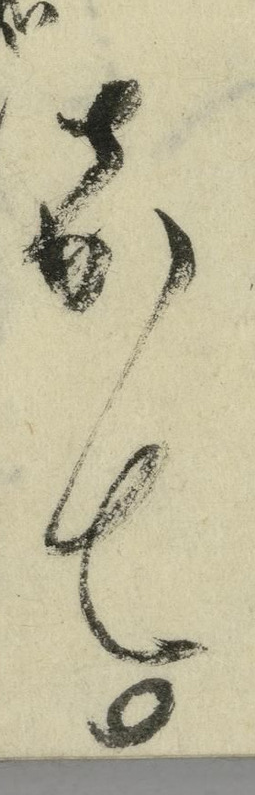金兵衛
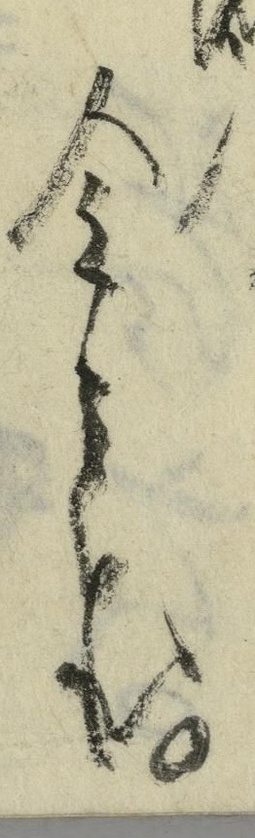金兵衛
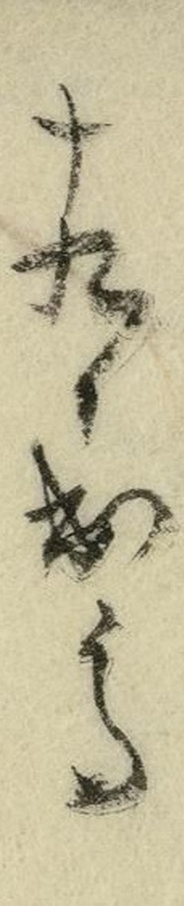十九日出高
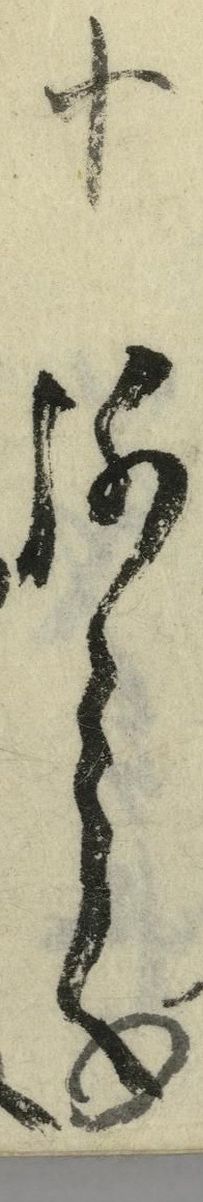十弥兵衛

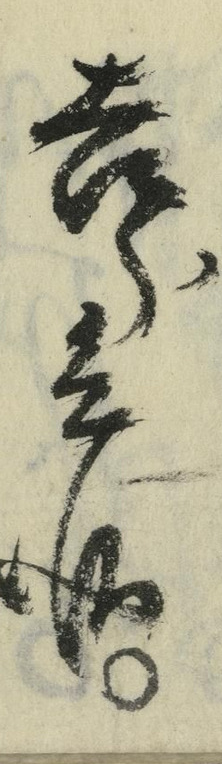吉郎兵衛
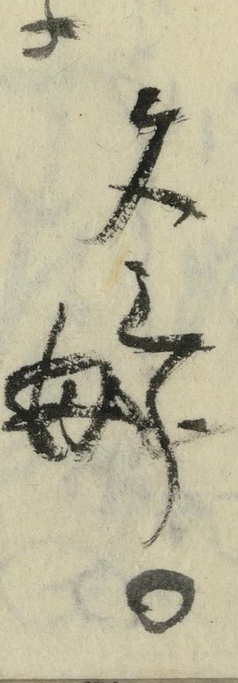文三郎
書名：天明淺間噴火ニ関スル書類
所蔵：東京大学地震研究所図書室 Earthquake Research Institute Library, The University of Tokyo, JAPAN
